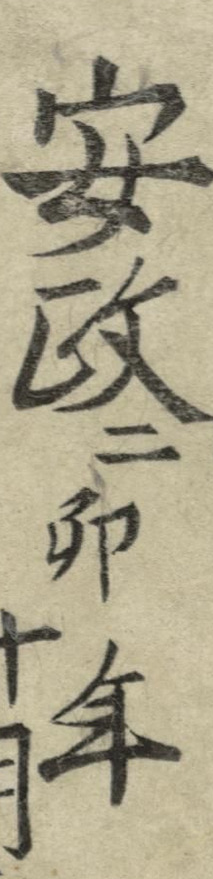安政二卯年
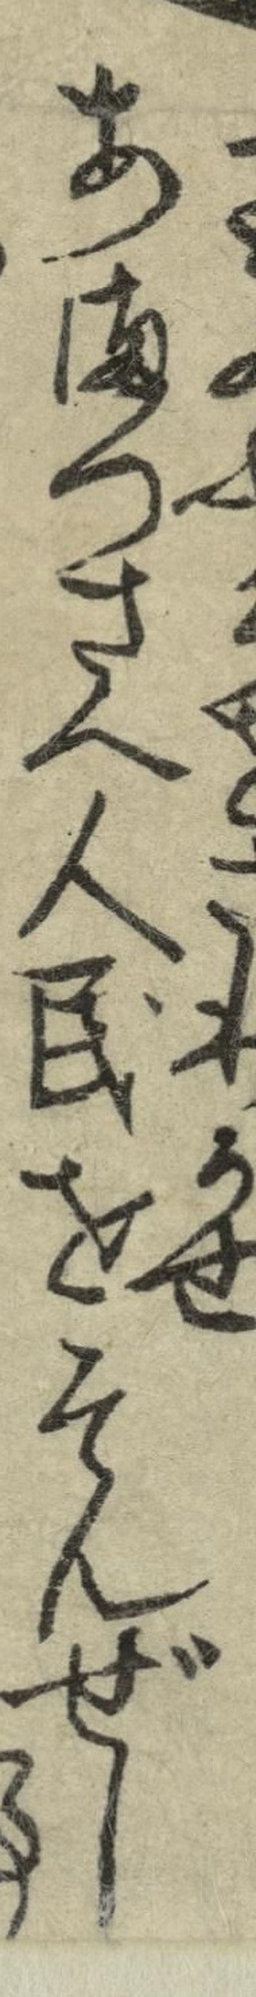あまつさへ人民をそんぜし事
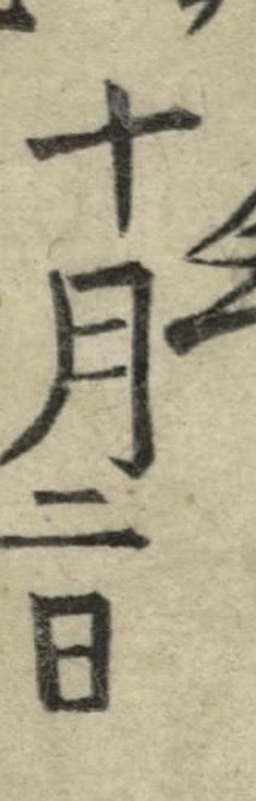十月二日
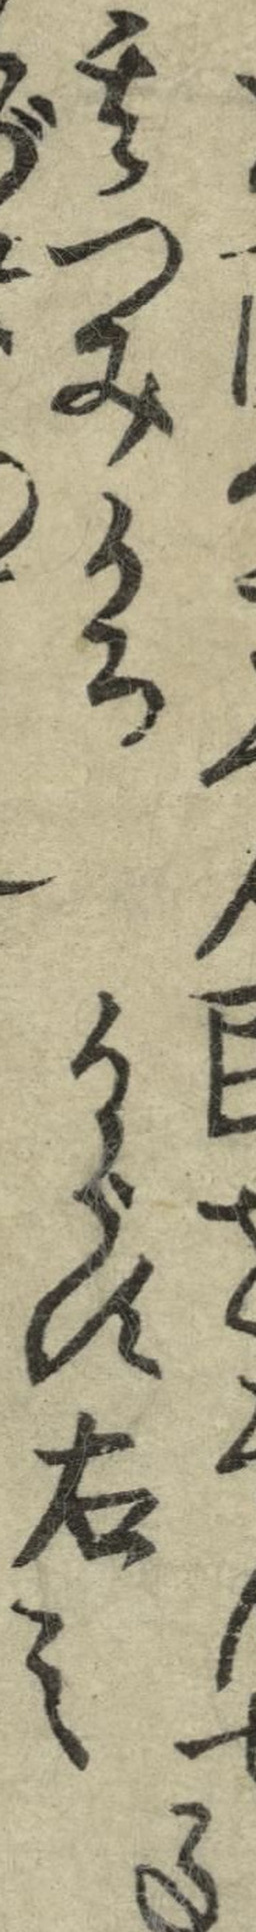其つみかろからす右之
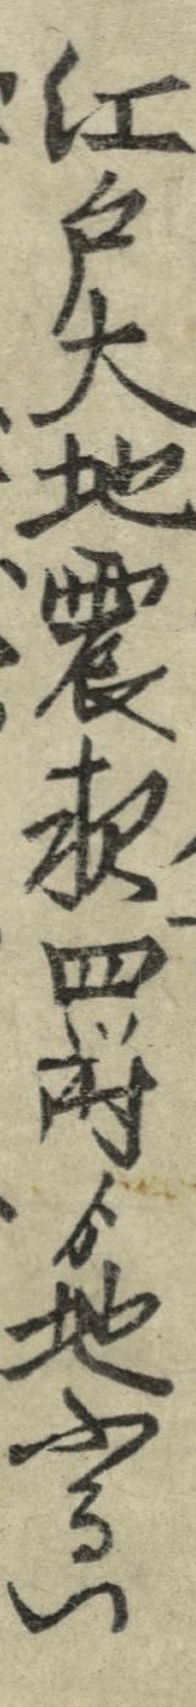江戸大地震夜四ツ時ゟ地ふるい
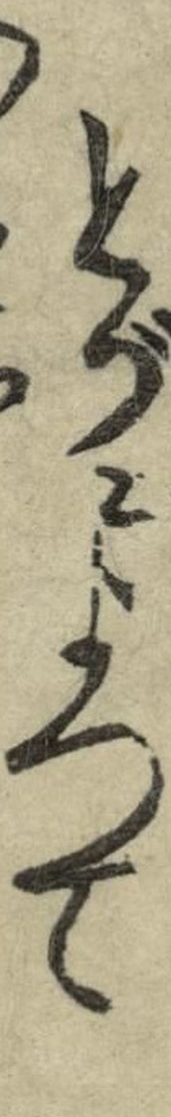とがニよつて
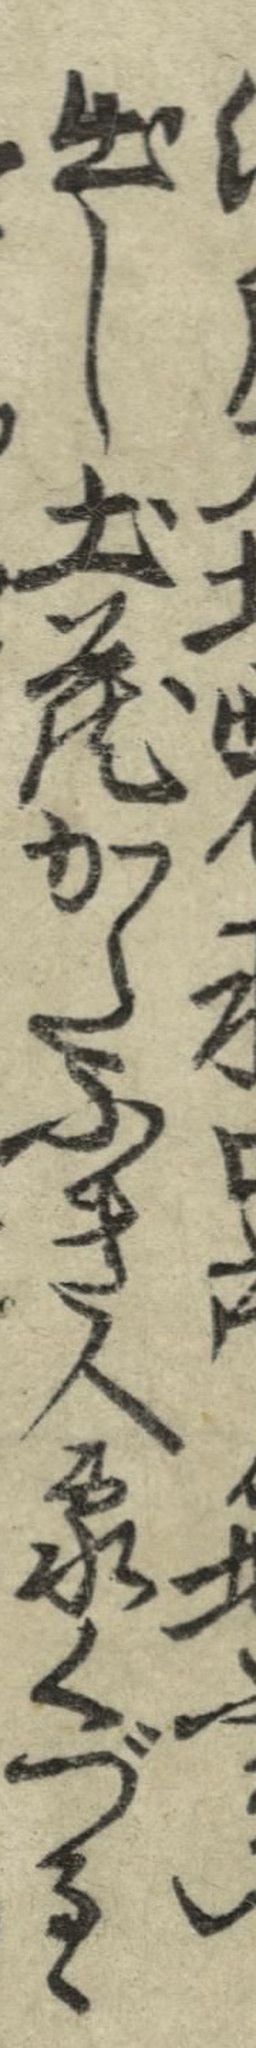出し土蔵かたふき人家くづるゝ
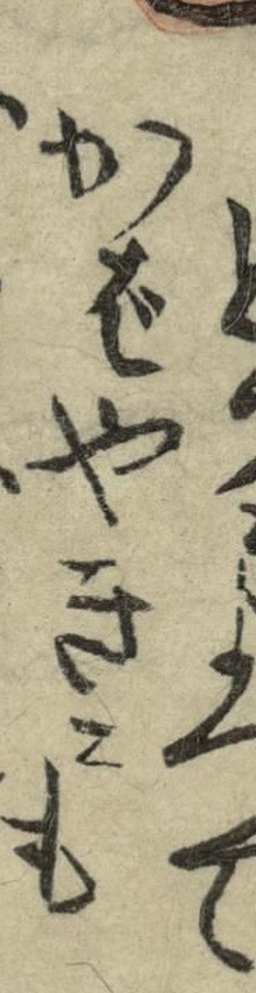かばやきニも
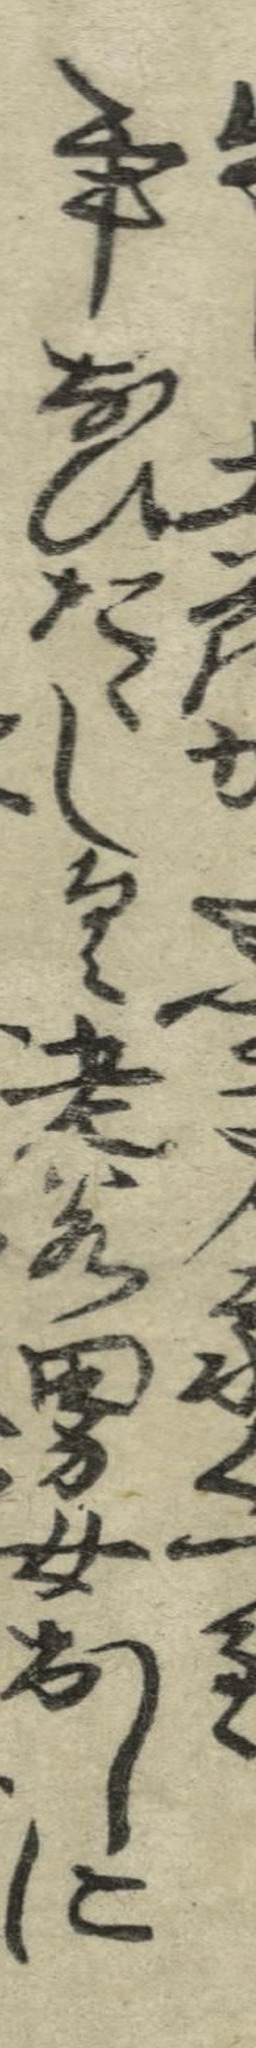事おひたゝしく老若男女おしこし
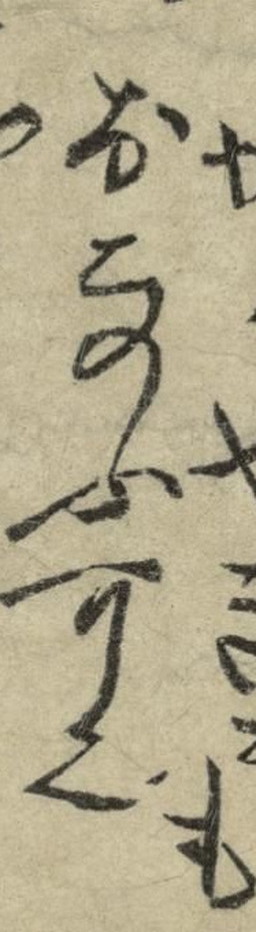おこのふ可也
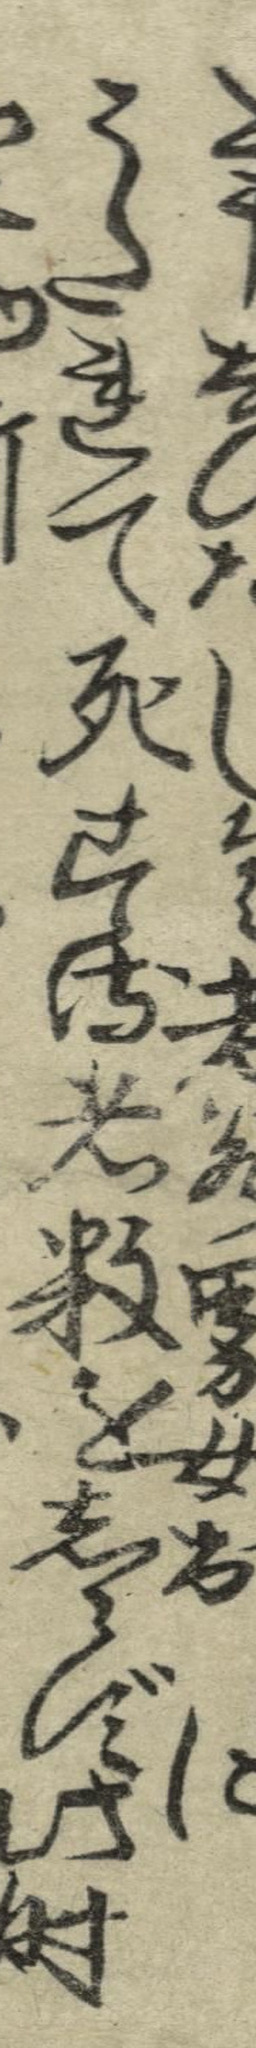うたれて死す待者数をしらず此時
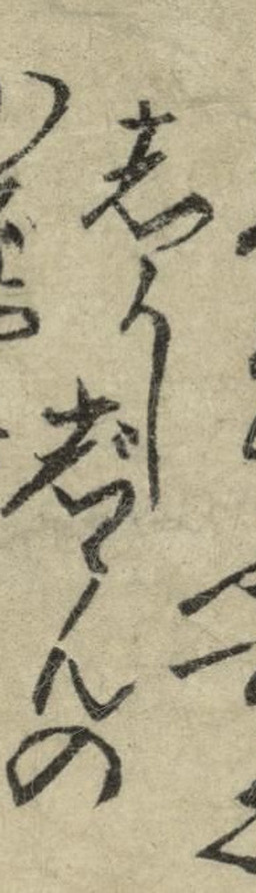しかしじゝんの
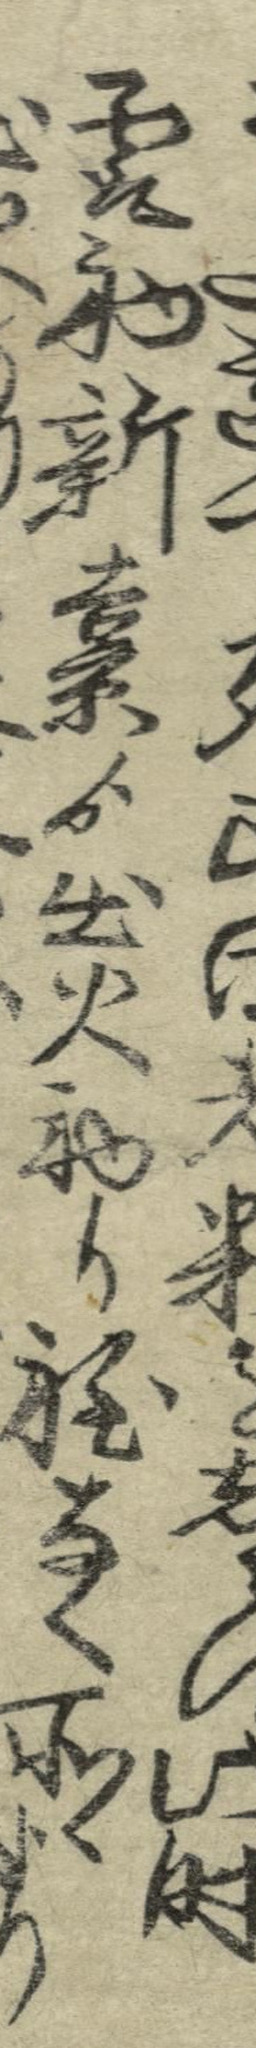最初新吉原ゟ出火初り程なく所々より
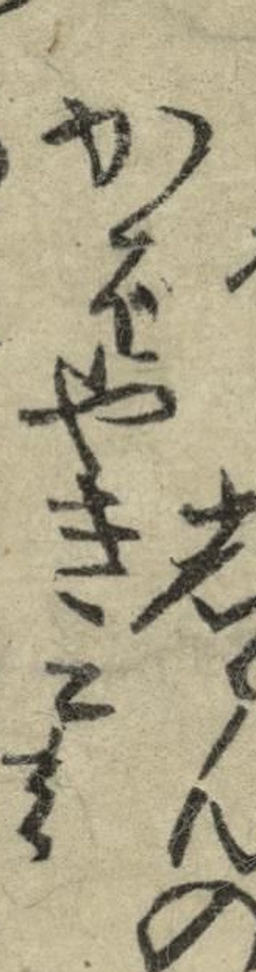かはやきニは
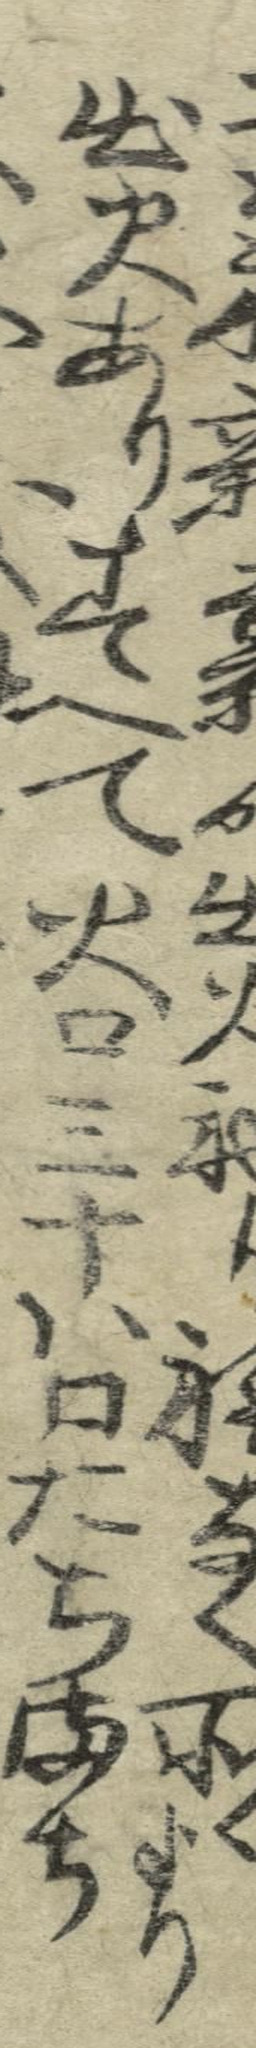出火ありすへて火口三十八口たちまち
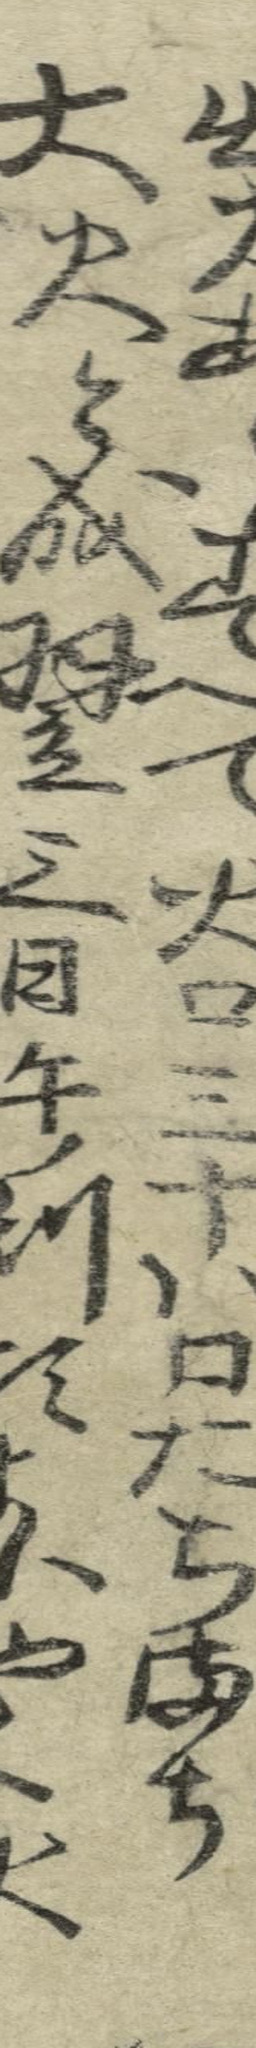大火と成翌三日午ノ刻頃よふやく火
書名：太平安心之為
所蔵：東京大学地震研究所図書室 Earthquake Research Institute Library, The University of Tokyo, JAPAN
